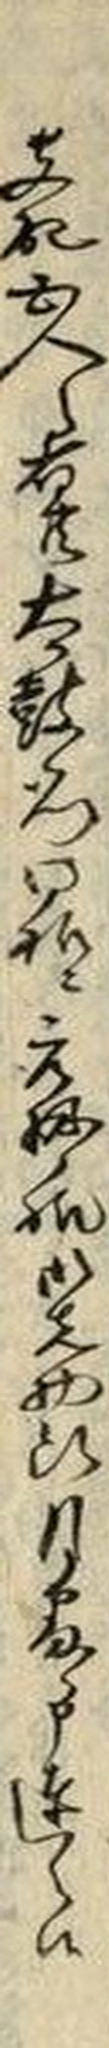支配五人之者共太鼓御門同様ニ取扱候様御先物頭月番へ申達之候
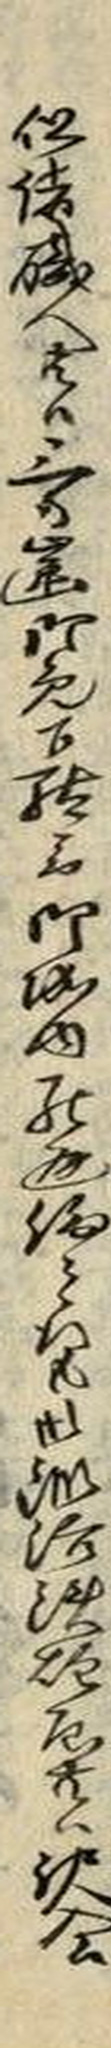但諸職人共ハ三ツ歯御免下駄ニ而御城内罷通例ニ候得共御鍛冶鉄砲屋共ハ訳合
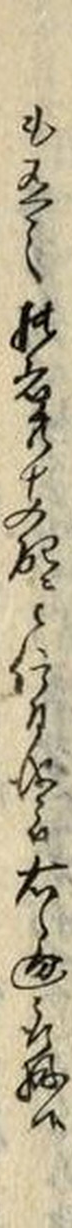も有之拙者共支配ニ被仰付儀ニ付右之通取扱候
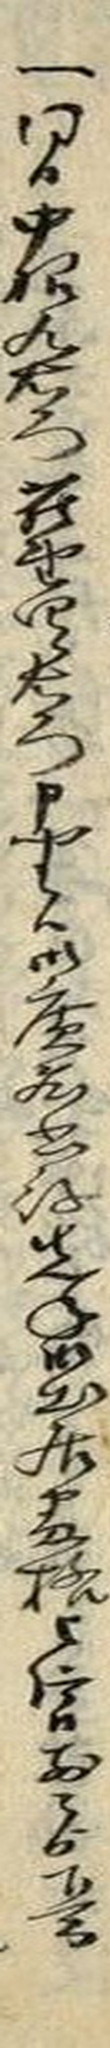一同日中根九右衛門荻野四郎右衛門申聞候ハ御広敷書役先年御出居番格被仰付前々ゟ下馬
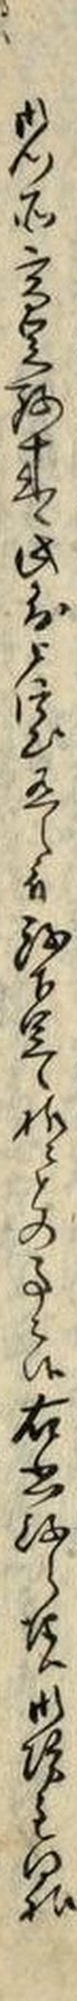御門所高足致来候此度被仰出有之候ニ付致下足候様ニとの事ニ候右書役之儀ハ御坊主同様
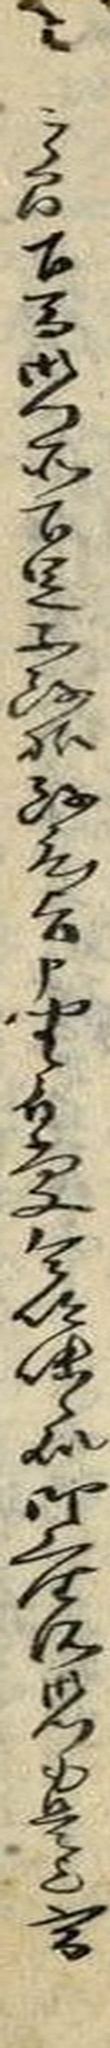ニ候間下馬御門所下足不致様致度旨申聞候ニ付尚又令吟味候処御座所御門も是迄高
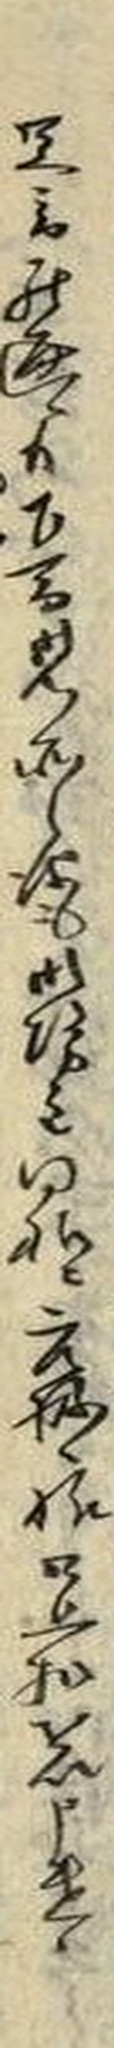足ニ而罷通候付下馬御門所之儀も御坊主同様ニ取扱候様口上扣を以申遣候
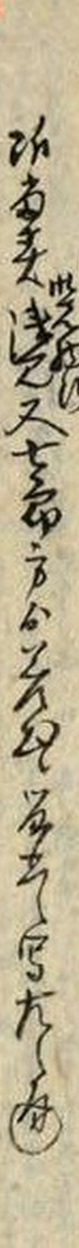附当春御先物頭浅見又七郎方ゟ差出候留書之写左之通

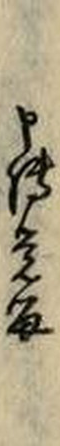申伝覚留
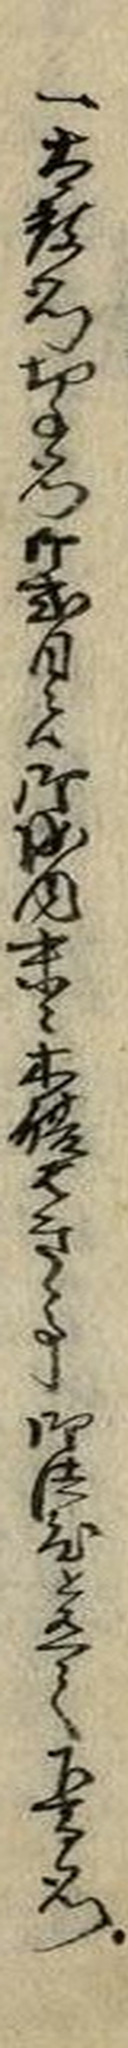一太鼓御門切手御門御式日ニハ御城内末々木履はき候事御法度と有之下馬御門
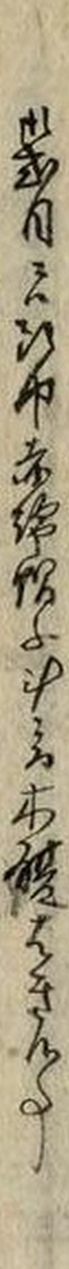御式日ニハ頭巾赤綿帽子斗ニ而木履はき候事
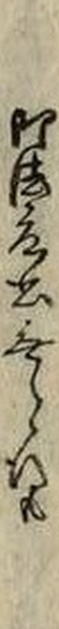御法度書無之候得共
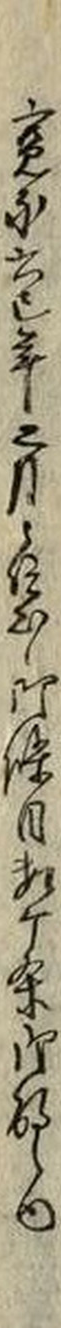寛永六己年二月被仰出候御条目数ヶ条御触之内
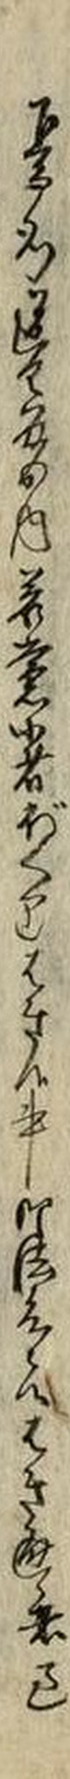下馬御門道具留ゟ内若党小者ぼくりはき候事御法度ニ候はき通り候者過
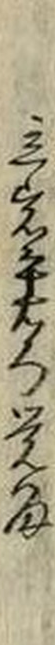立岩平右衛門覚留
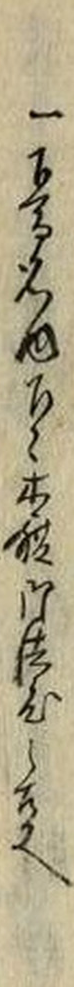一下馬御門内下々木履御法度之事
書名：御門御櫓之部
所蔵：福井県文書館 Fukui Prefectural Archives
